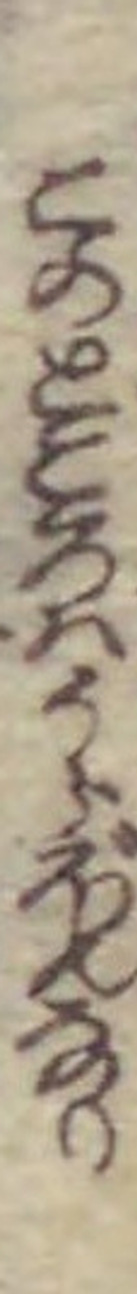このところはうらぼんなり
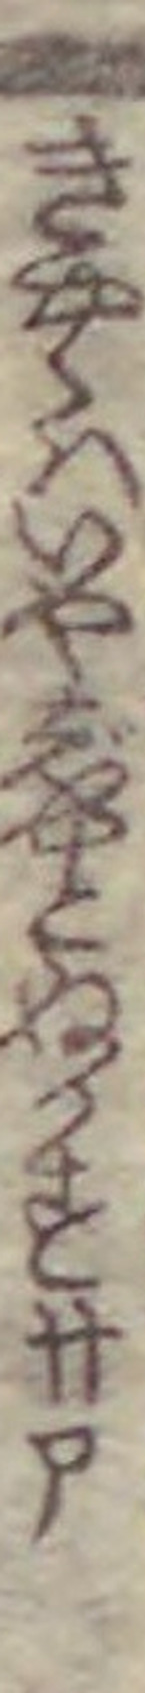きやくはいやじやとぬかすサア
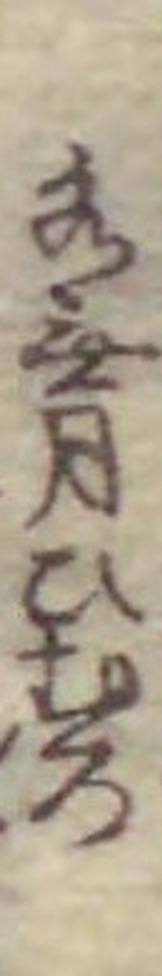水無月ひむろ
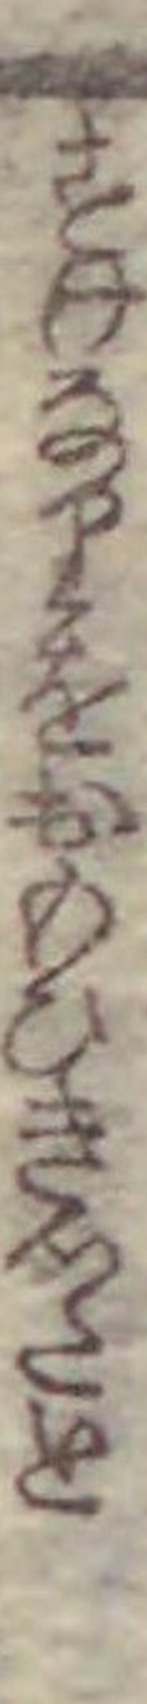すけなりをおもひきつたと
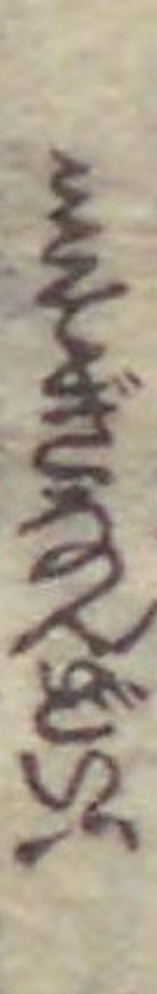みそぎなんどいふ
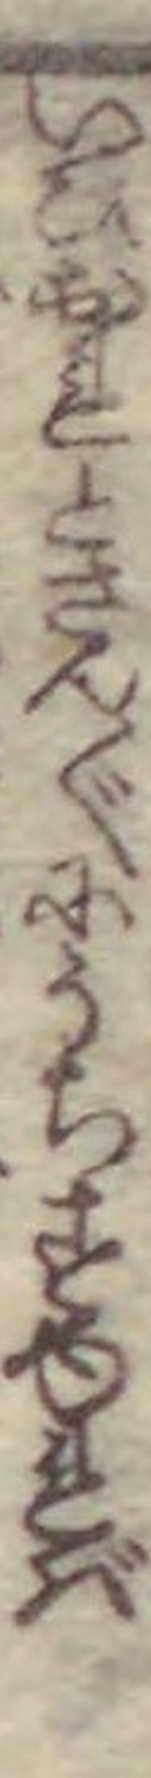いひおれとさん〴〵にうちすゆれば
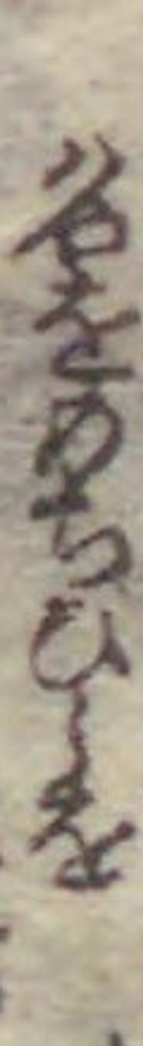なをもちひしを
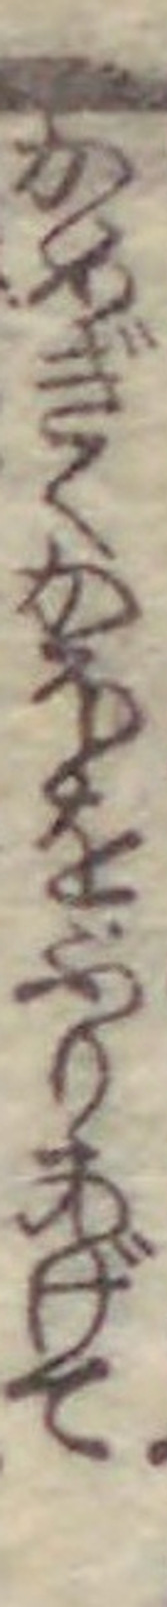かめぎくかほをふりあげて
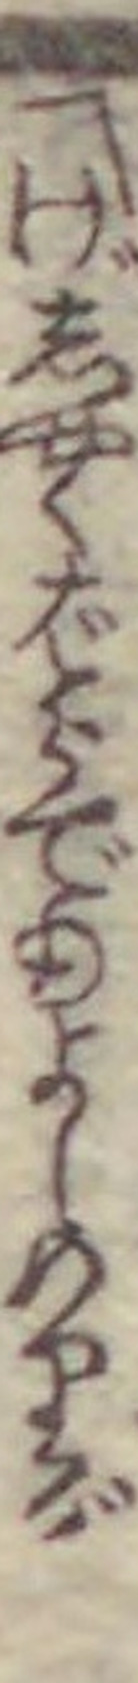〽げしやくばらでもよしもりが
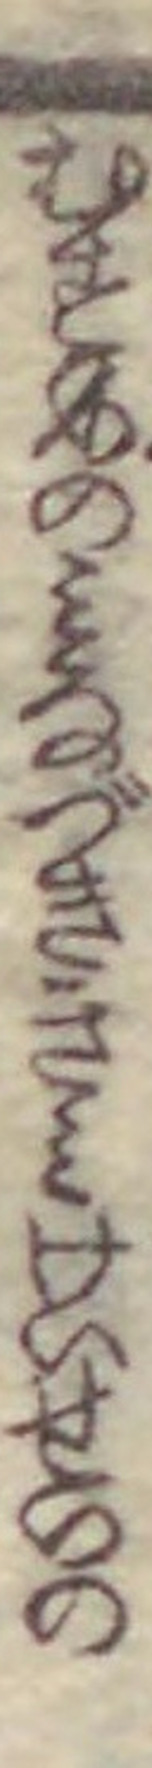むすめのみなづききみけいせいの
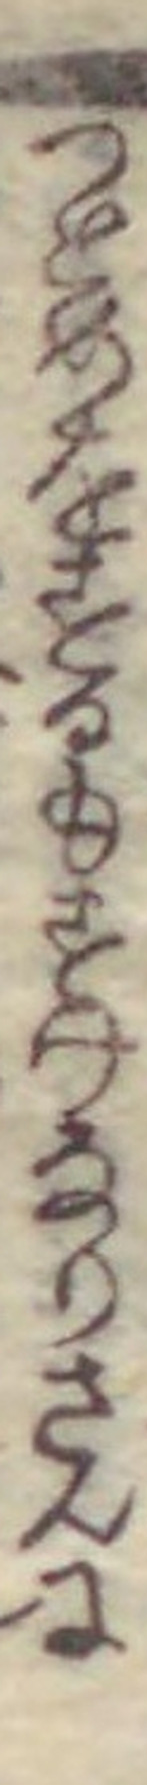つとめをするもすけなりさんに
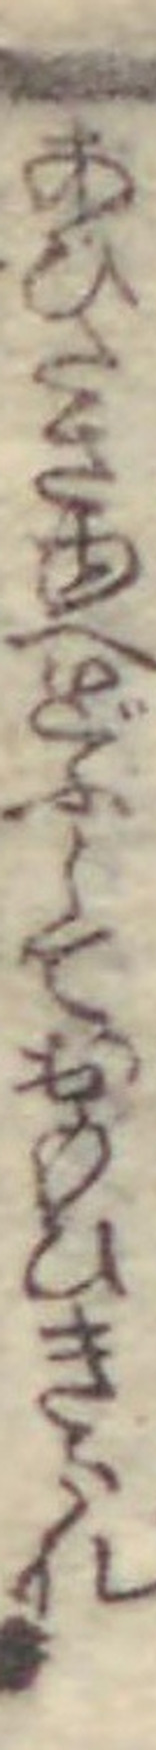あひたきゆへどふしておもひきられ
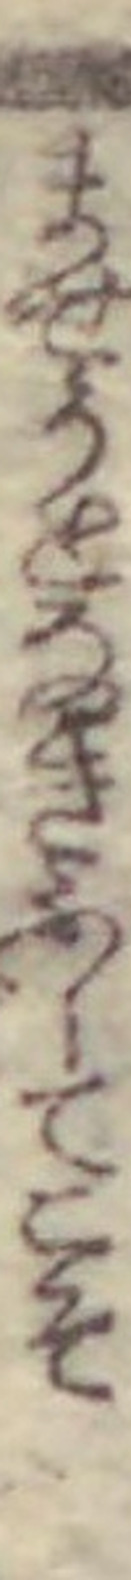ませうとなきふしてこそ
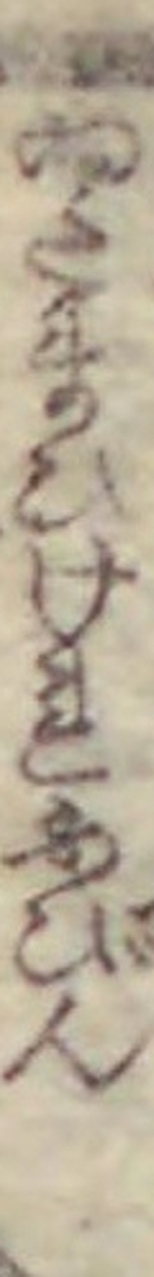ゐたまひけれふびん
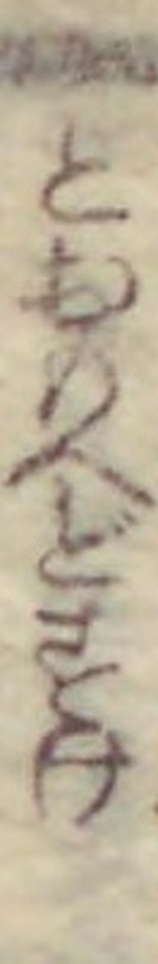とおもへどすけ
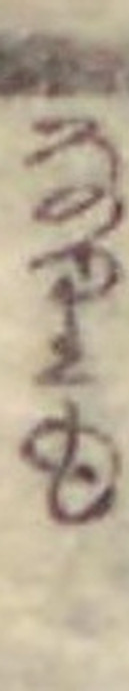なりも
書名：大時代唐土化物 3巻. 曽我太夫染
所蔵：国立国会図書館 National Diet Library, JAPAN
